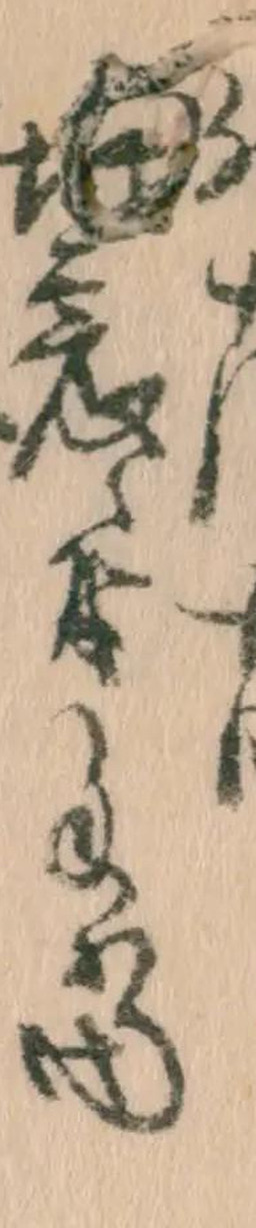地震ニ付家主
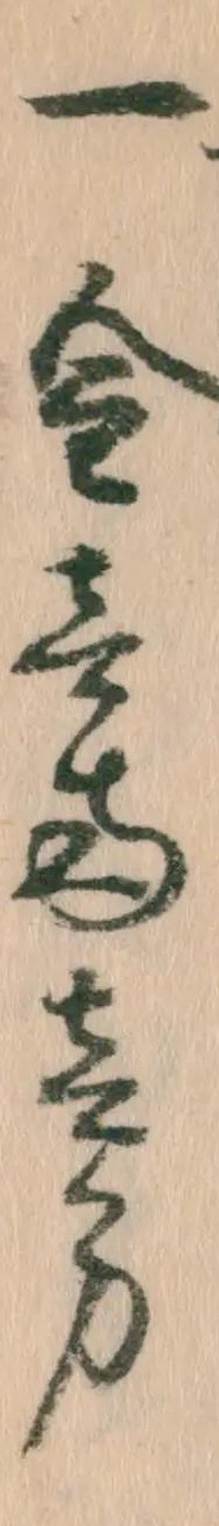一金壱両壱分
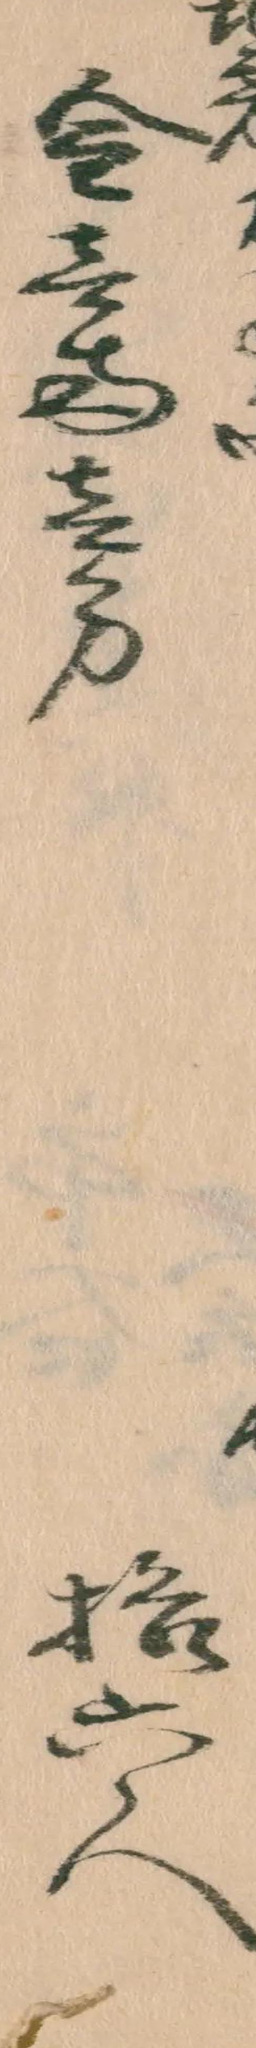一金壱両壱分拾六人
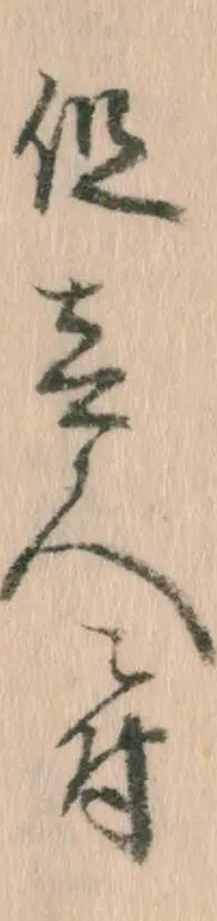但壱人ニ付
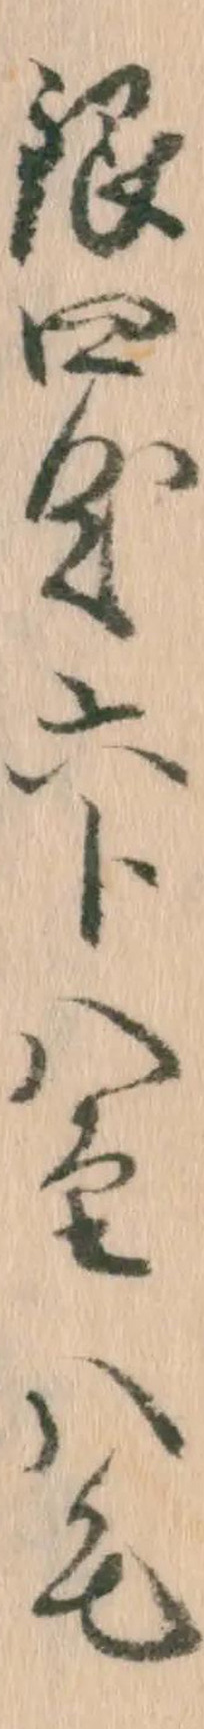銀四匁六分厘八毛
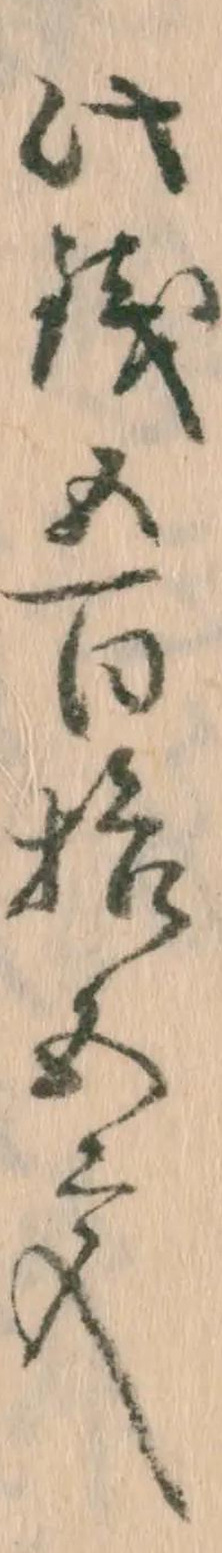此銭五百拾五文
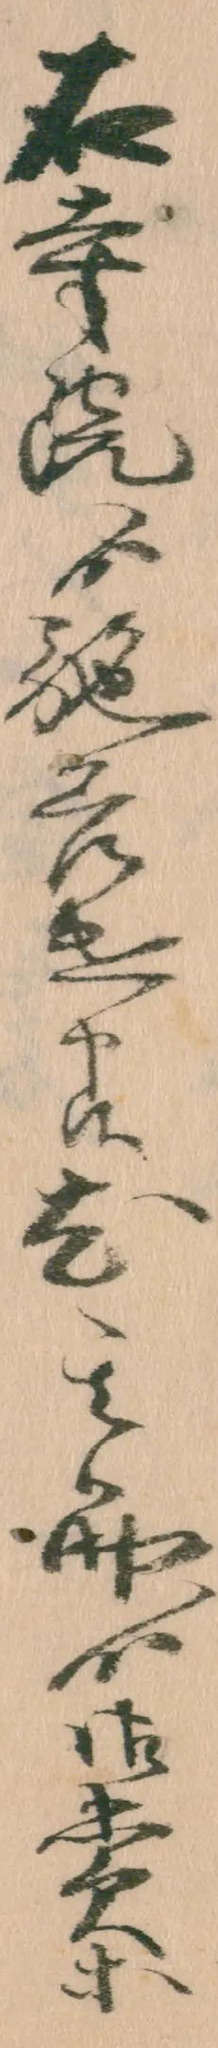右寺院ゟ施差出申候尤其筋ゟ御賞等
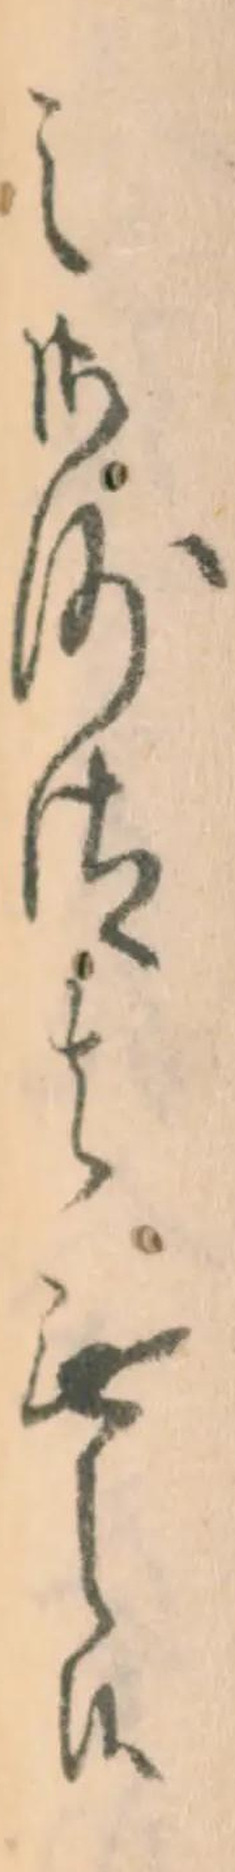之御沙汰は無之候
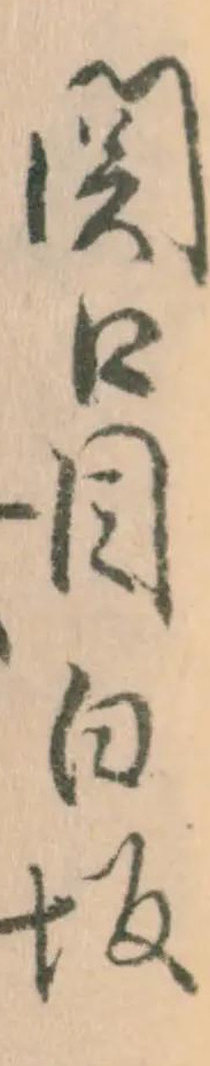関口目白坂
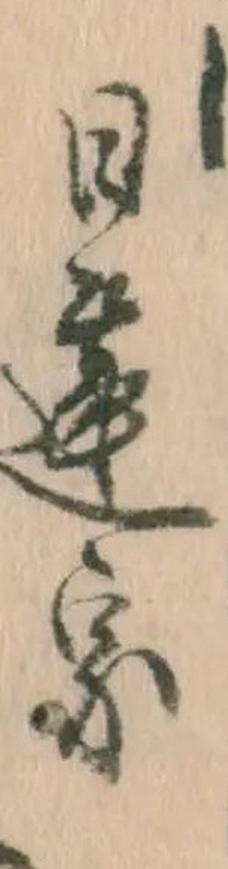日蓮宗
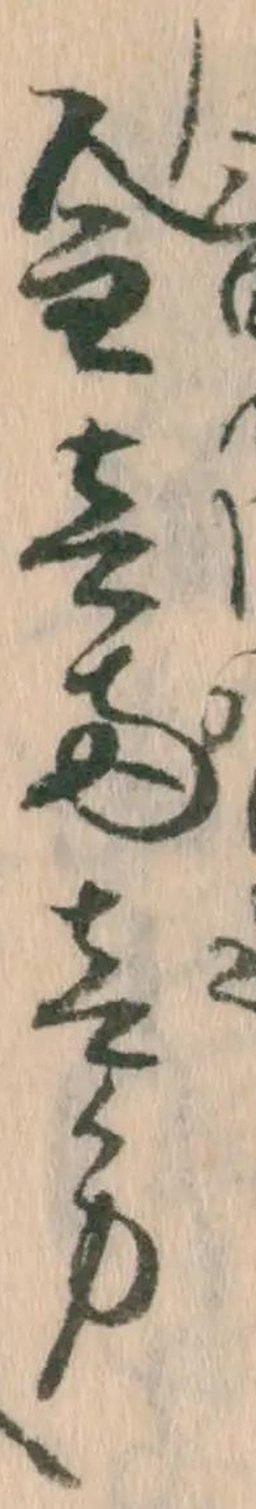一金壱両壱分
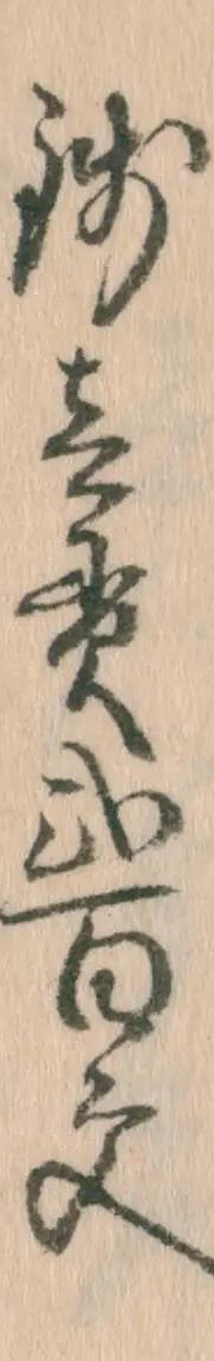銭壱貫弐百文
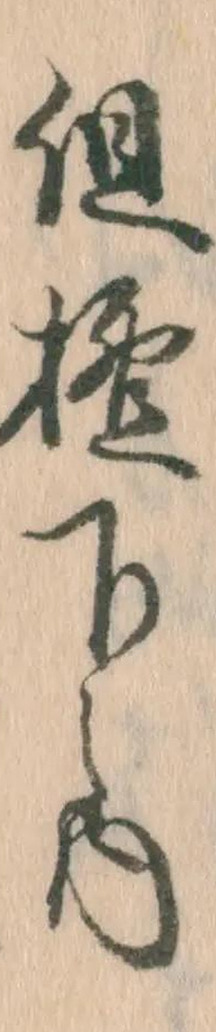但檀下之内
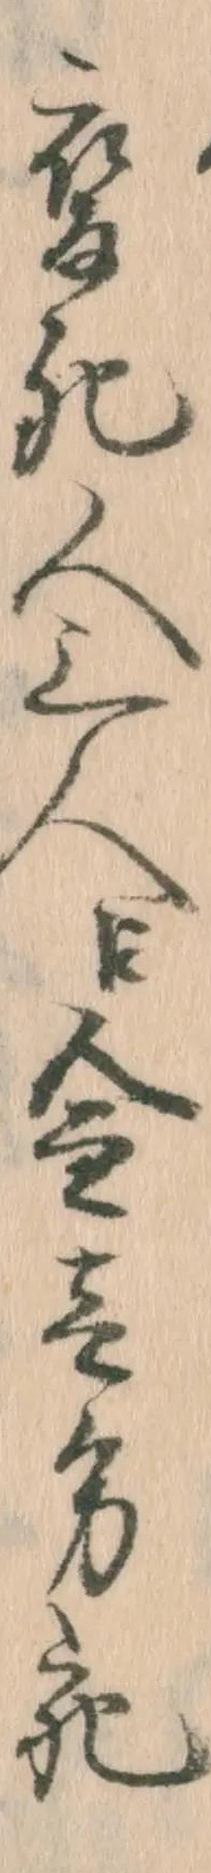変死人三人え金壱分宛
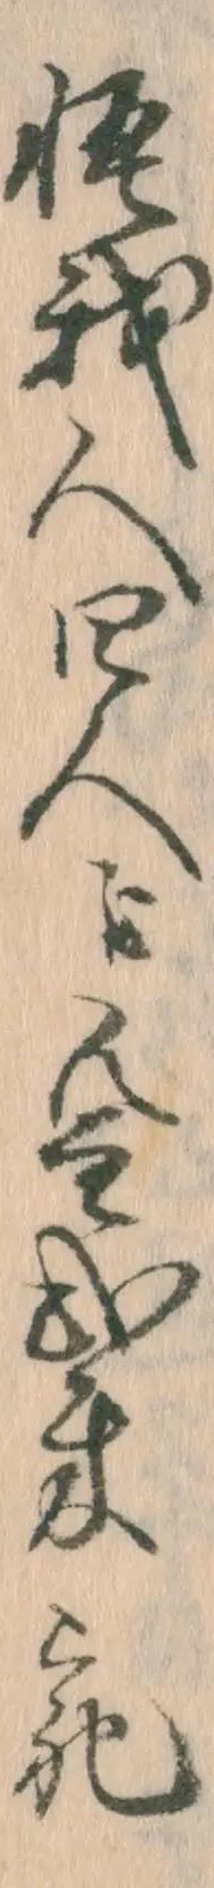怪我人四人え金弐朱宛
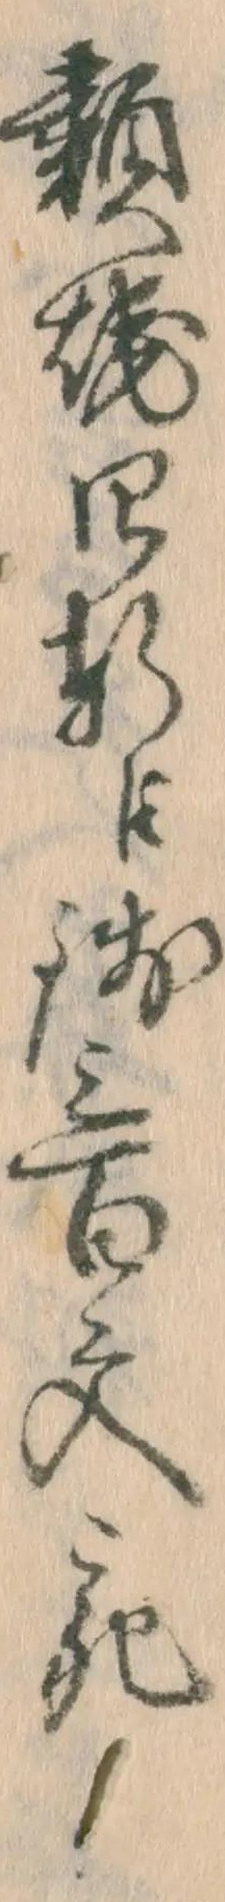類焼四軒え銭三百文宛
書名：武家方并寺院等ニテ施差出候一件
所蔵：国立国会図書館 National Diet Library, JAPAN
